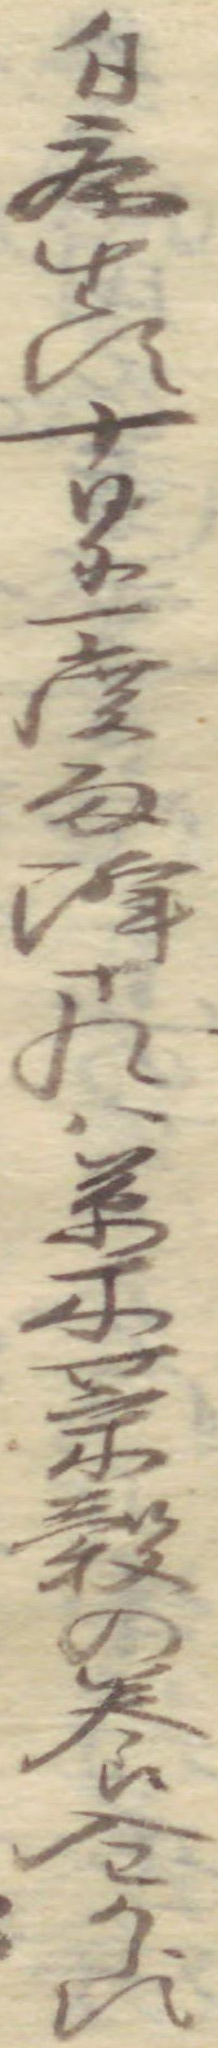付病生す十日に一度雨降されは草木菜穀の養全からす*
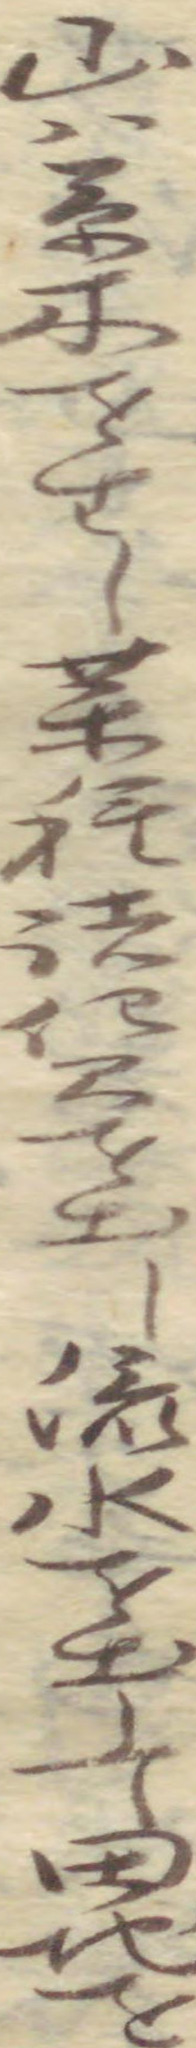山は草木を生し菜種諸賃を出し流水を出して田地を
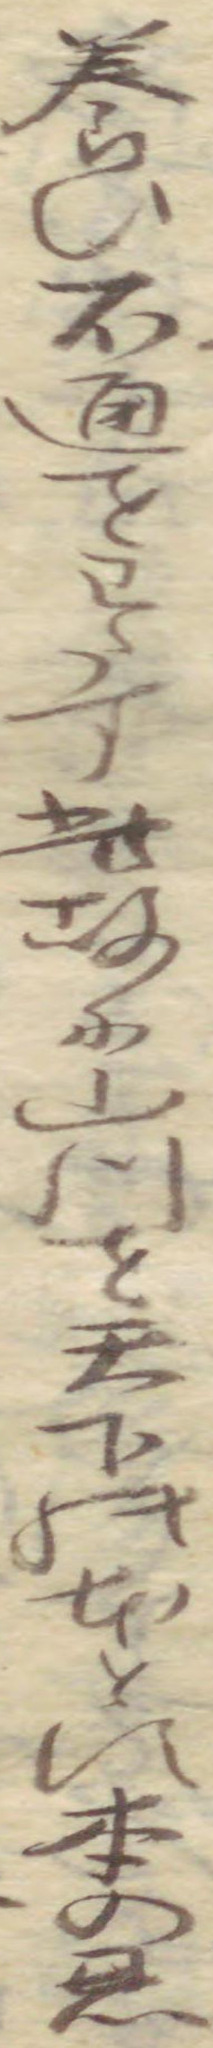養ひ不通をわたす此故に山川を天下の本とす本の恩
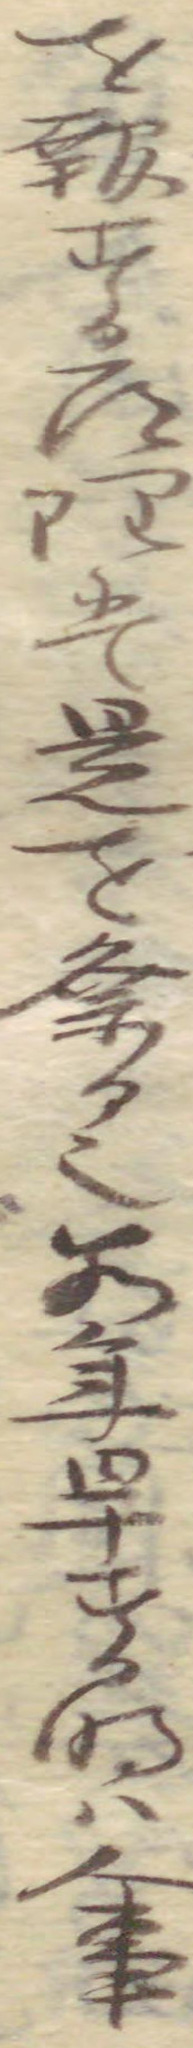を報する道理にて是を祭る也若年旱する時は人事
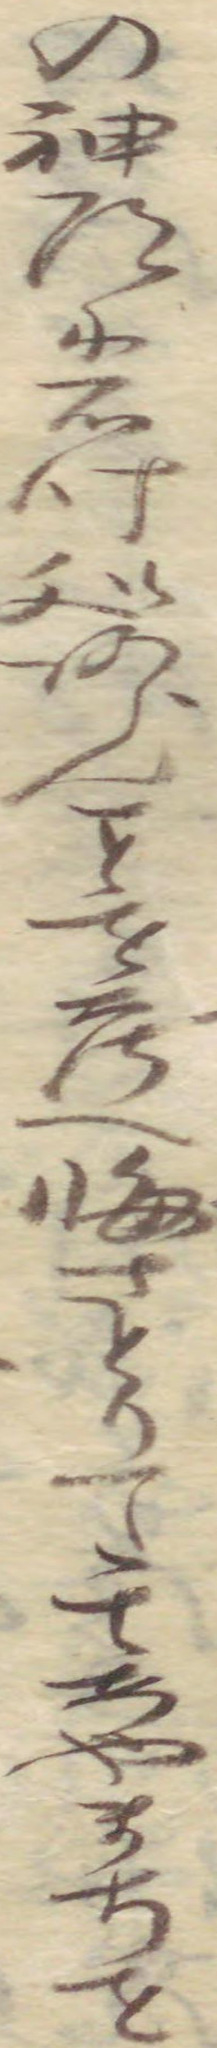の神道に不叶処あらんことを考へ悔さとりて其あやまちを
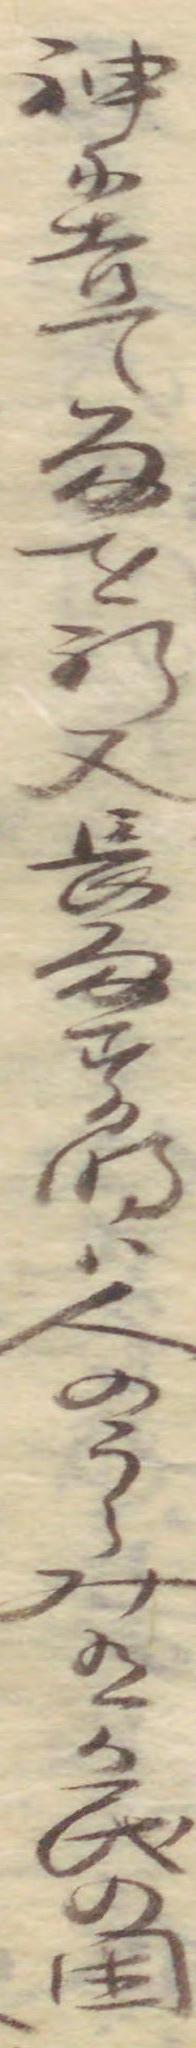神に告て雨を祈又長雨する時は人のうらみ有か民の困
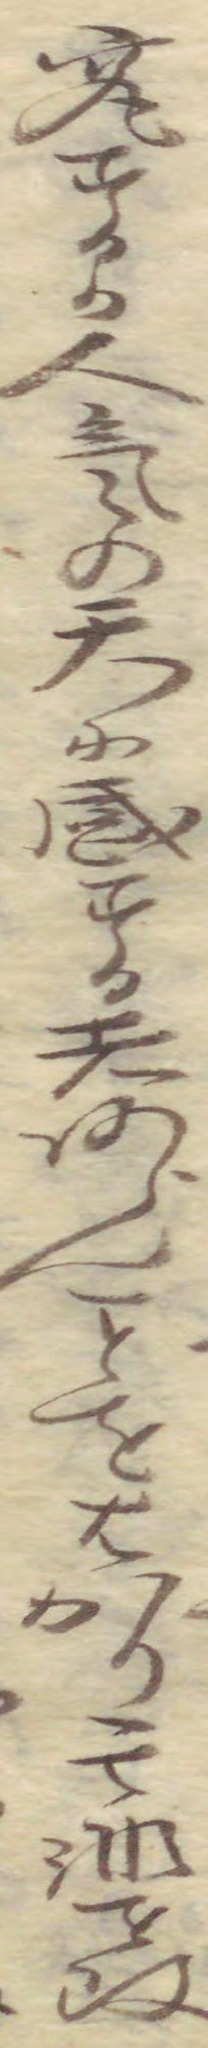窮するか人気の天に感する者あらんことをはかり其非を改
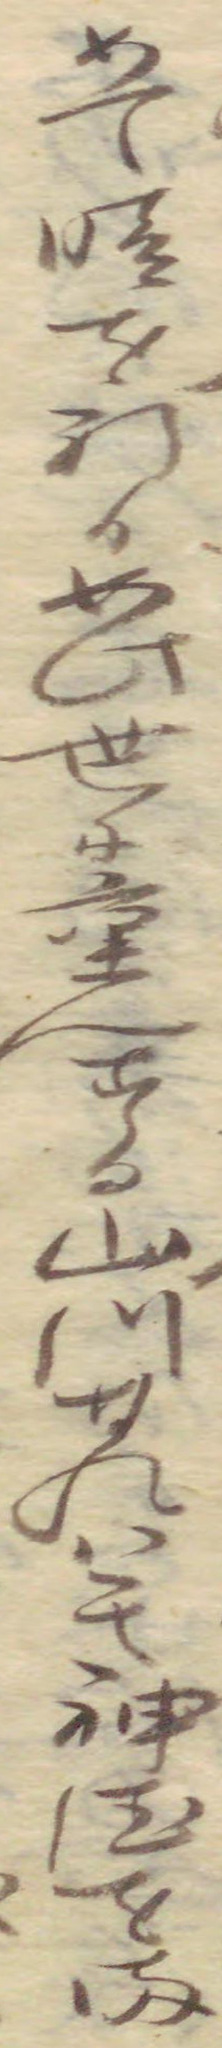めて晴を祈る如此世に重んする山川なれは其神徳をま
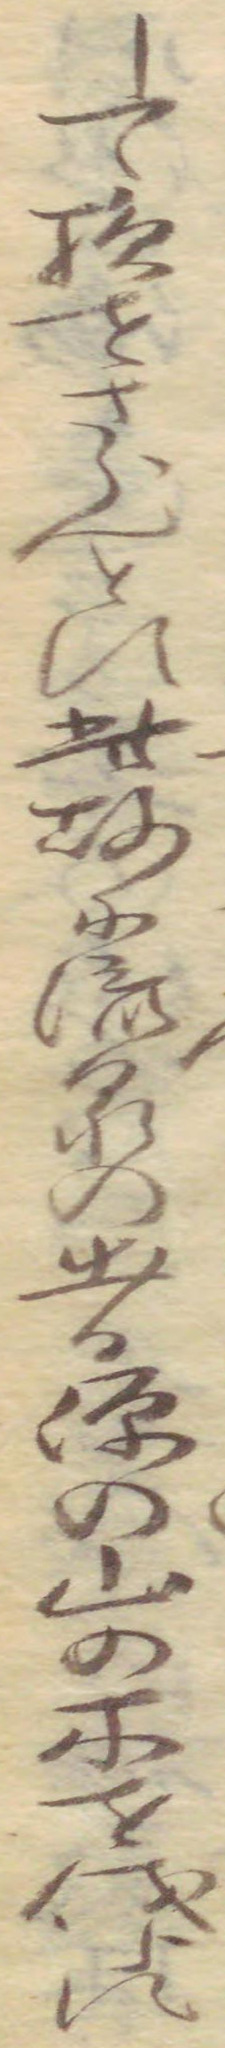して損せさらんとす此故に流泉の出る源の山の木を伐らす

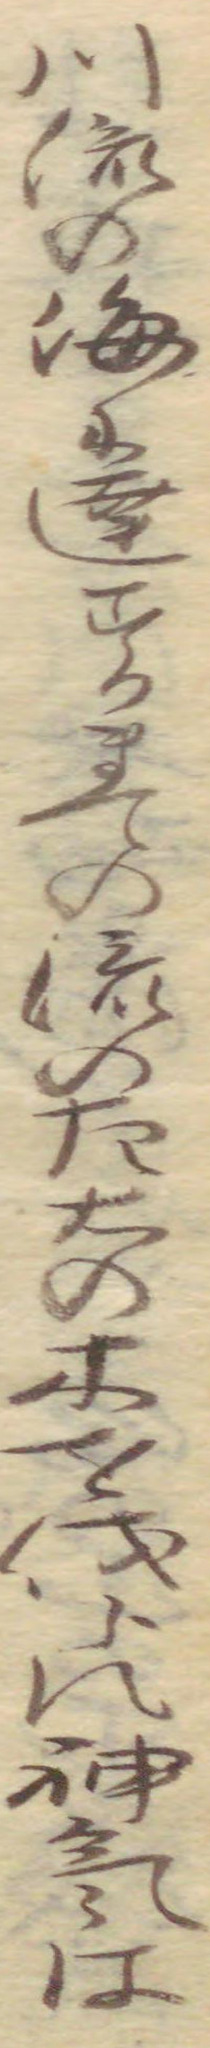川流の海に達するまての流の左右の木を伐らす神気は
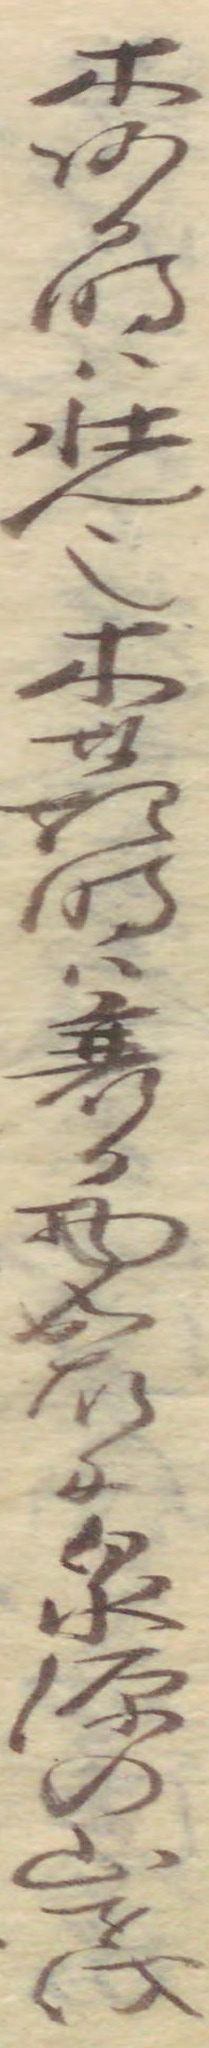木ある時は壮ん也木なき時は衰る物成故に泉源の山を伐
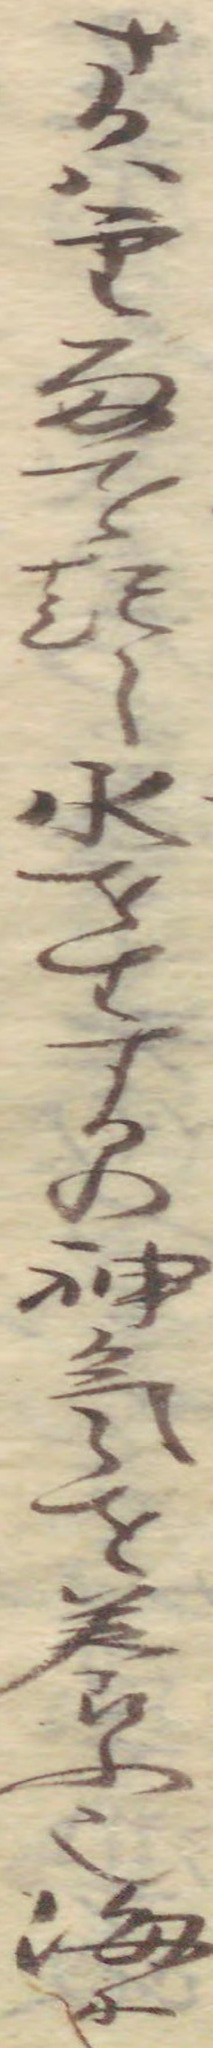さるは雲雨を起し水を生するの神気を養ふ也海に
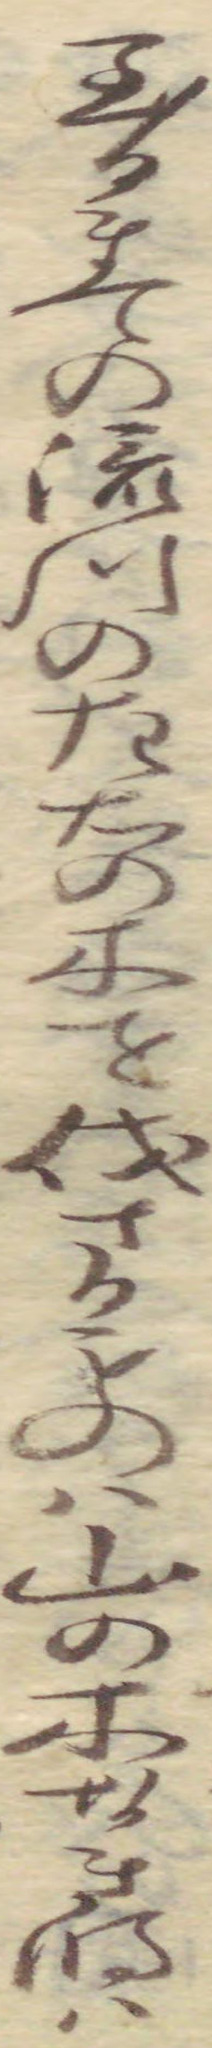至るまての流川の左右の木を伐さるものは山の木なき時は
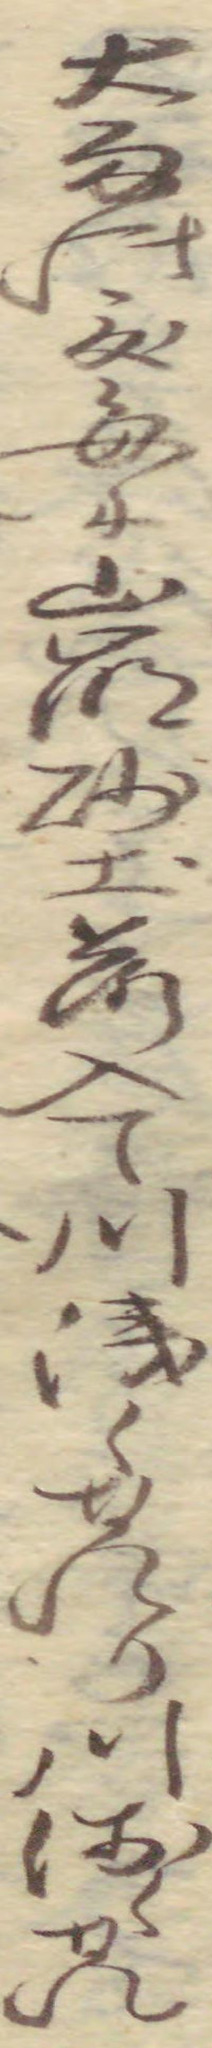大雨の度〻毎に山崩砂土落入て川浅くなれり川浅くなれ
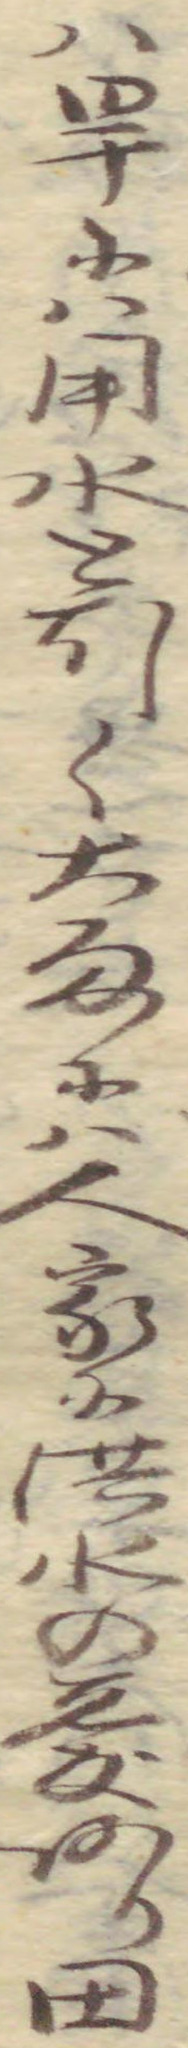は旱には用水とほしく大雨には人家に洪水の憂あり田
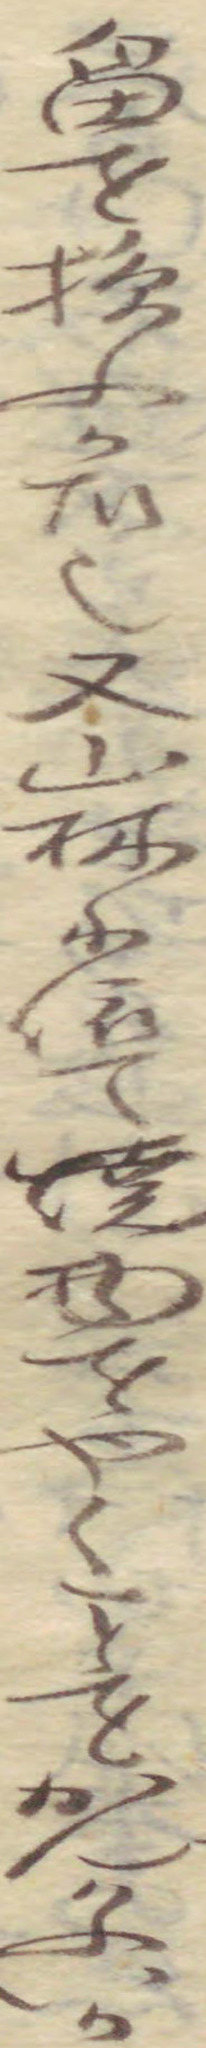畠を損ふか故也又山林に依て焼物をやくことをかんかふいか
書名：鶯宿雑記. 巻263-264
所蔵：国立国会図書館 National Diet Library, JAPAN
